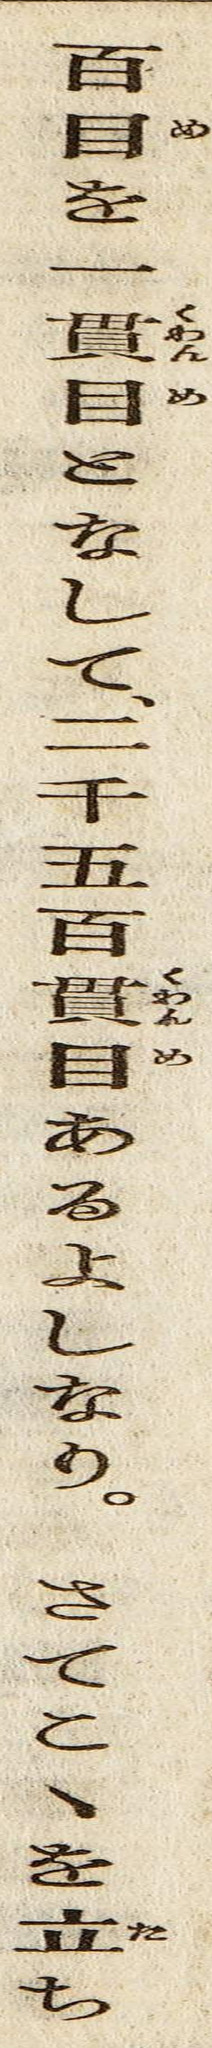百目を一貫目となして、二千五百貫目あるよしなり。さてこヽを立ち
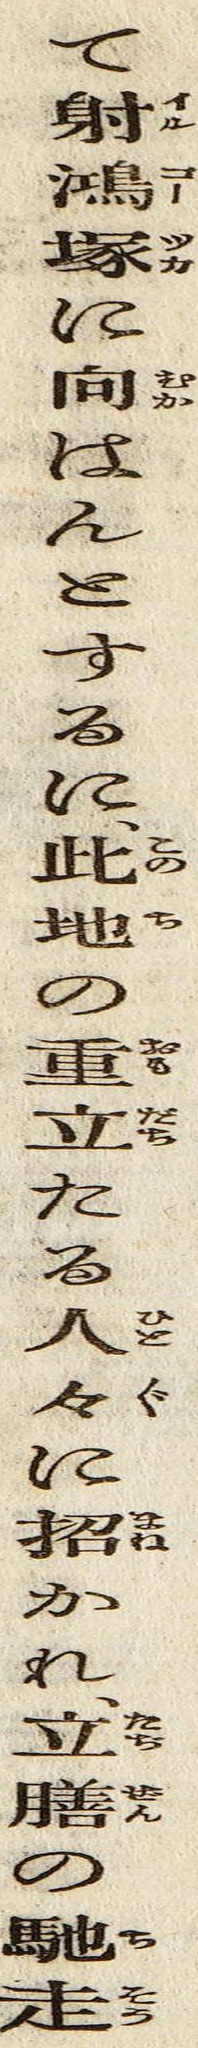て射鴻塚に向はんとするに、此地の重立たる人々に招かれ、立膳の馳走
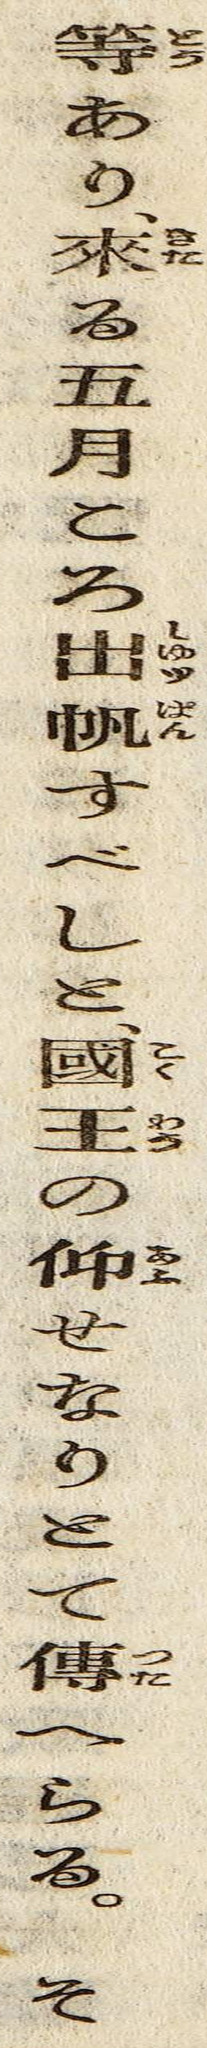等あり、来る五月ころ出帆すべしと、国王の仰せなりとて伝へらる。そ
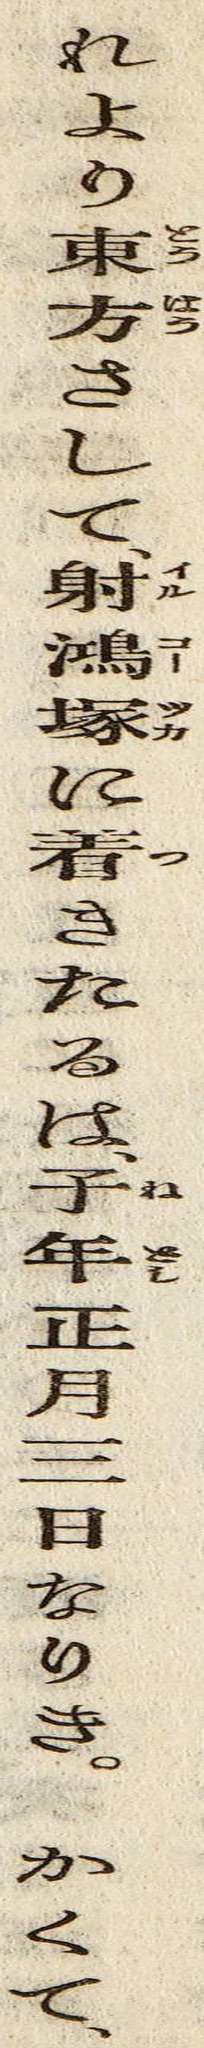れより東方さして、射鴻塚に着きたるは、子年正月三日なりき。かくて、
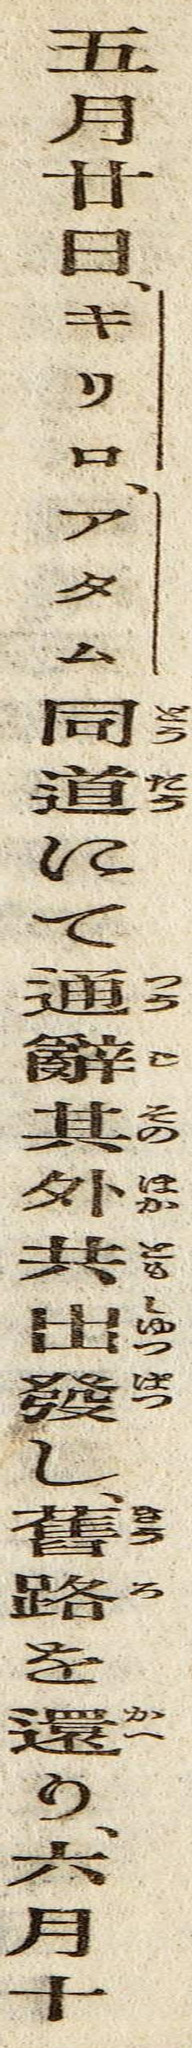五月廿日、キリロ、アタム同道にて通辞其外共出発し、旧路を還り、六月十
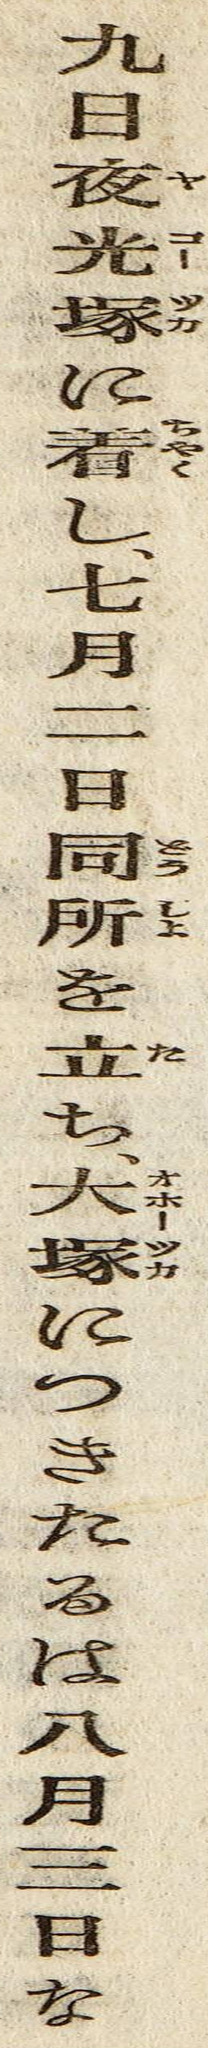九日夜光塚に着し、七月二日同所を立ち、大塚につきたるは八月三日な
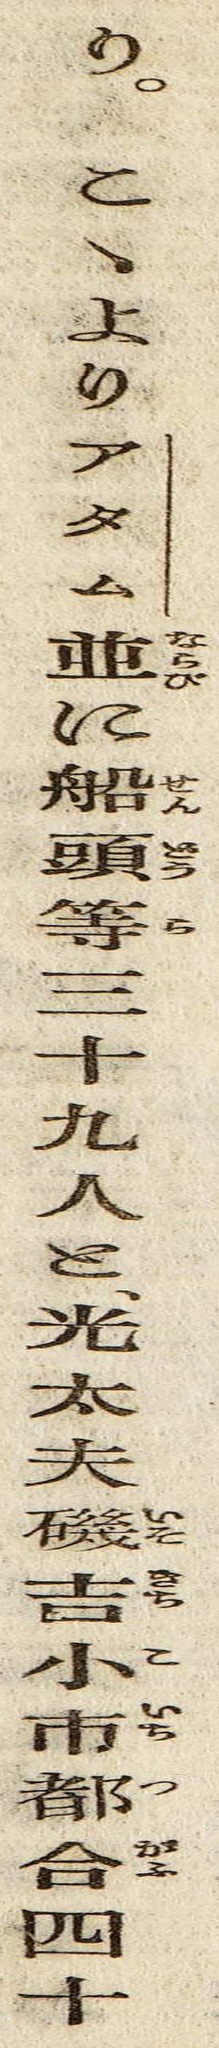り。こゝよりアタム並に船頭等三十九人と光太夫磯吉小市都合四十

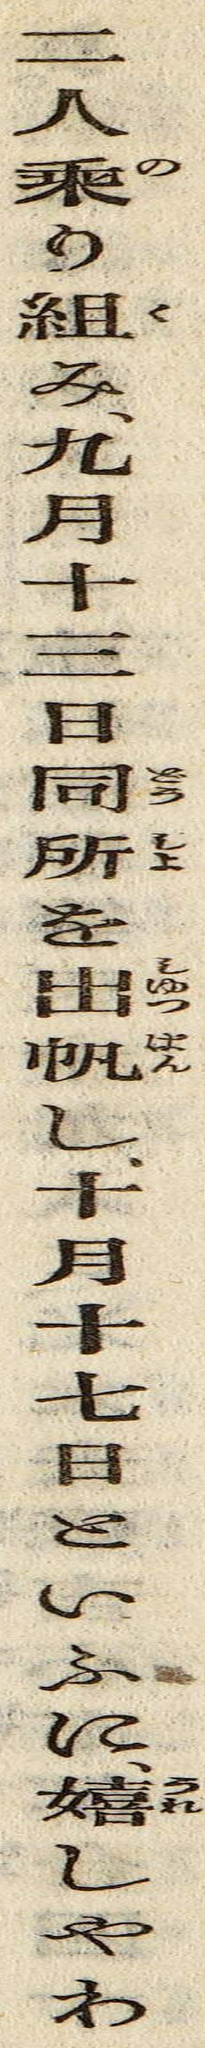二人乗り組み、九月十三日同所を出帆し、十月十七日といふに、嬉しやわ
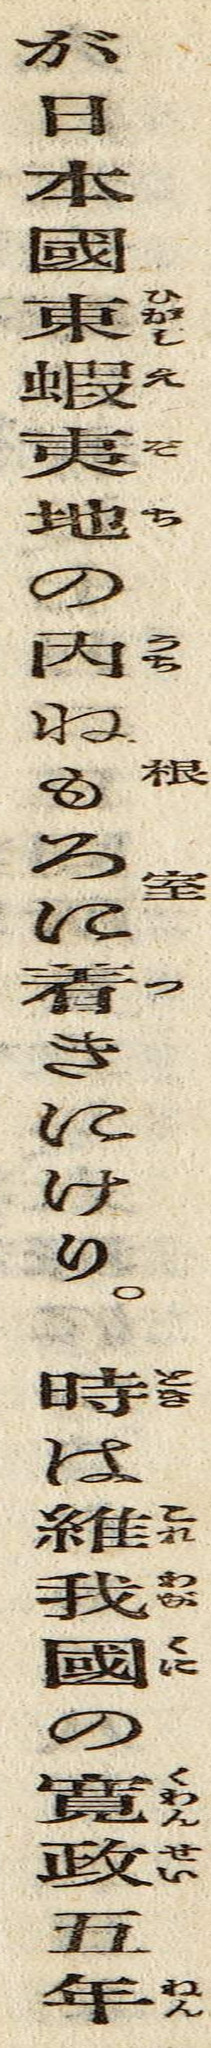が日本国東蝦夷地の内ねもろに着きにけり。時は維我国の寛政五年
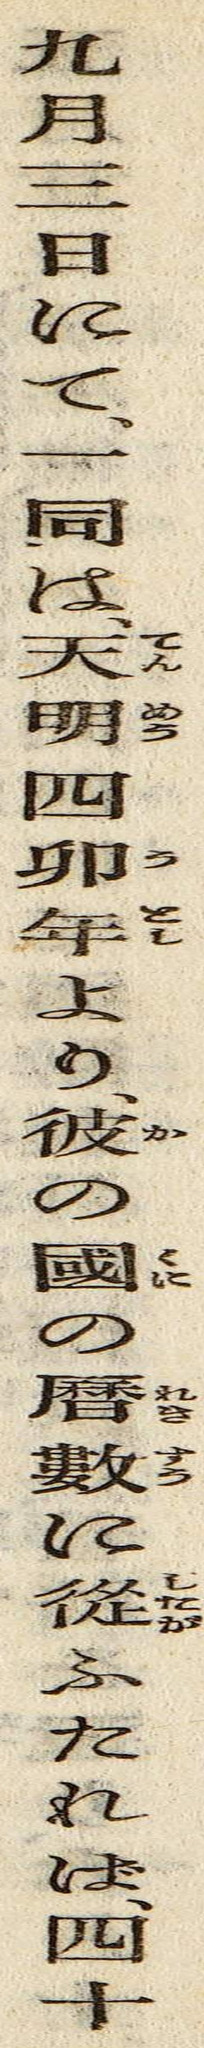九月三日にて、一同は、天明四卯年より、彼の国の歴数に従ふたれば、四十
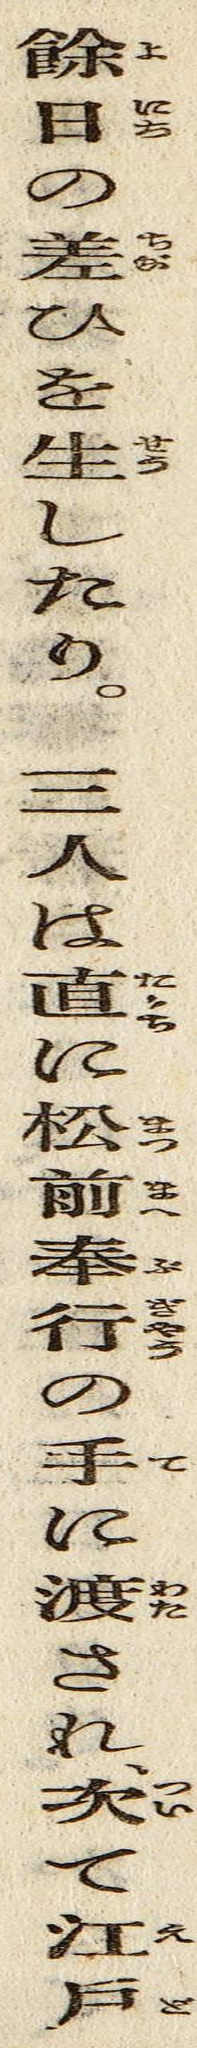余日の差ひを生したり。三人は直に松前奉行の手に渡され、次て江戸
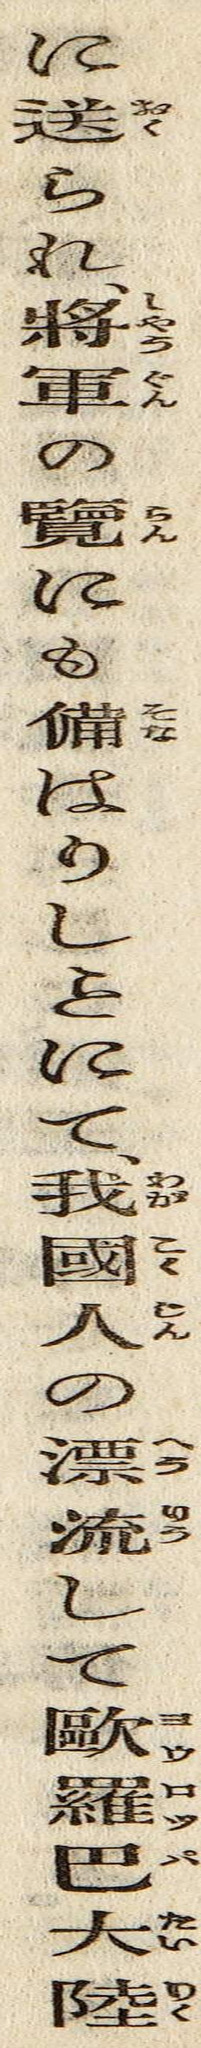に送られ、将軍の覧にも備はりしことにて、我国人の漂流して欧羅巴大陸
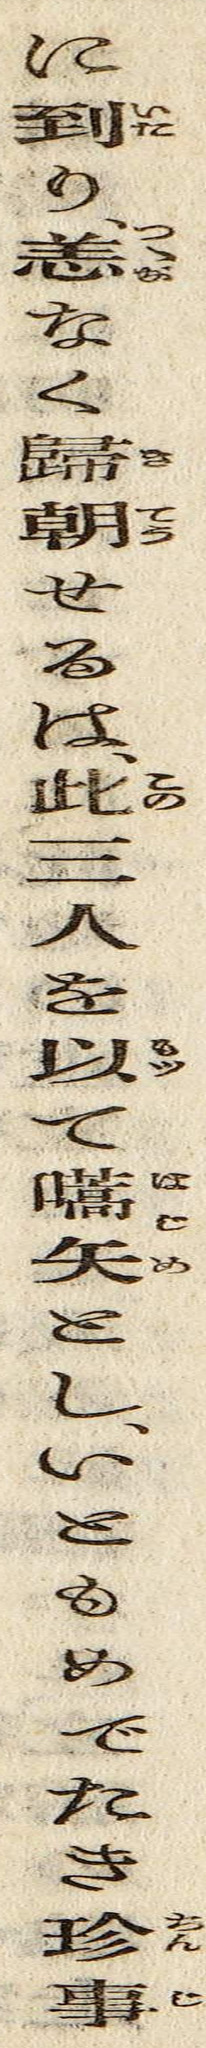に到り、恙なく帰朝せるは、此三人を以て嚆矢とし、いともめでたき珍事
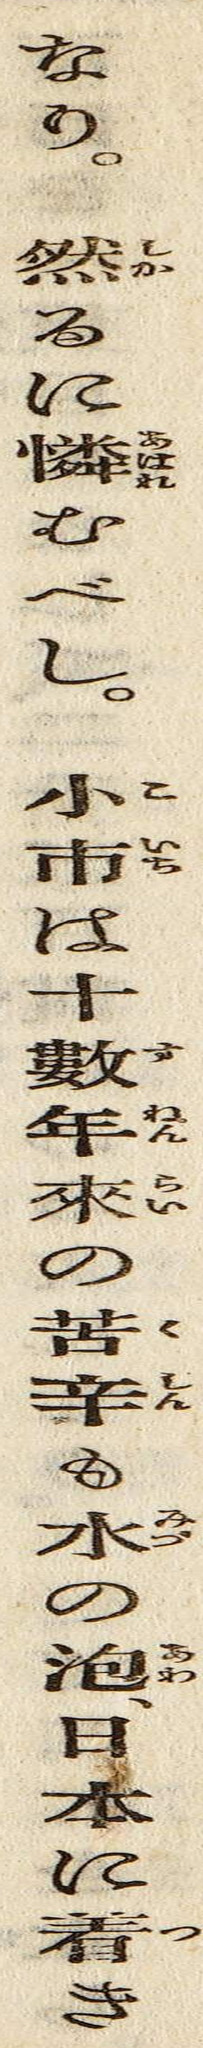なり。然るに憐むべし。小市は十数年来の苦辛も水の泡、日本に着き
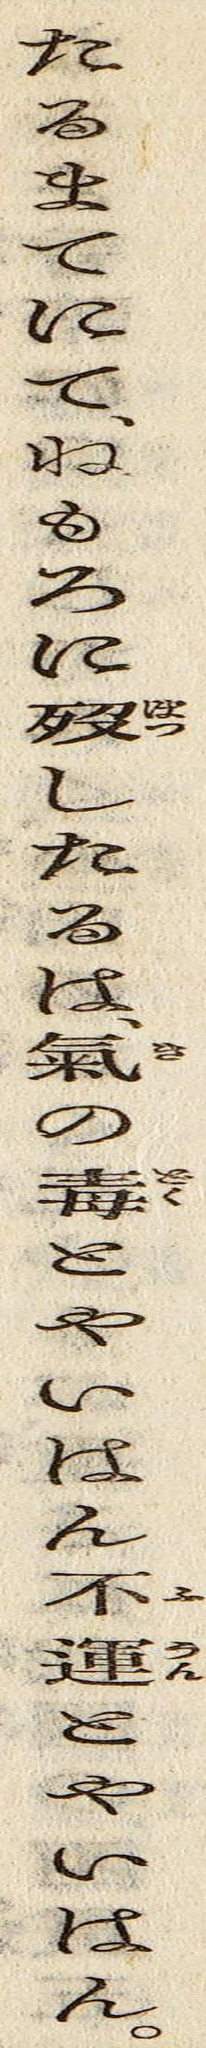たるまてにて、ねもろに没したるは、気の毒とやいはん不運とやいはん。
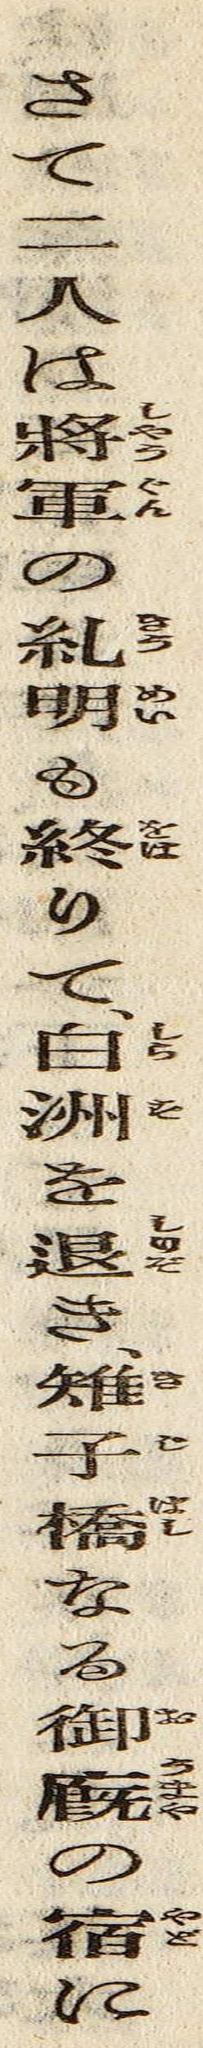さて二人は将軍の糾明も終りて、白洲を退き、雉子橋なる御厩の宿に
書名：日本漂流譚
